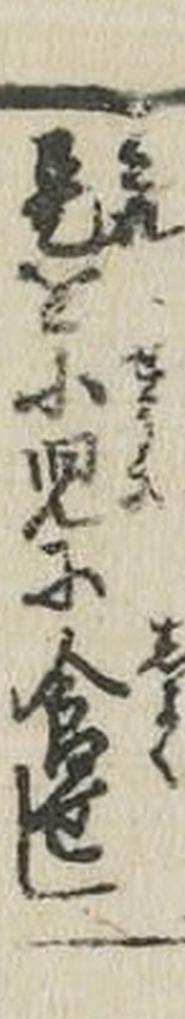是を小児に食せし
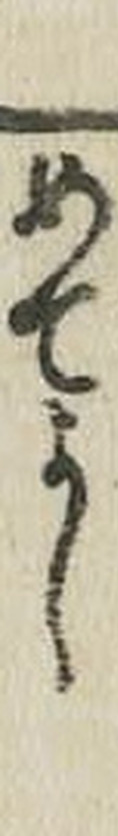めてよし
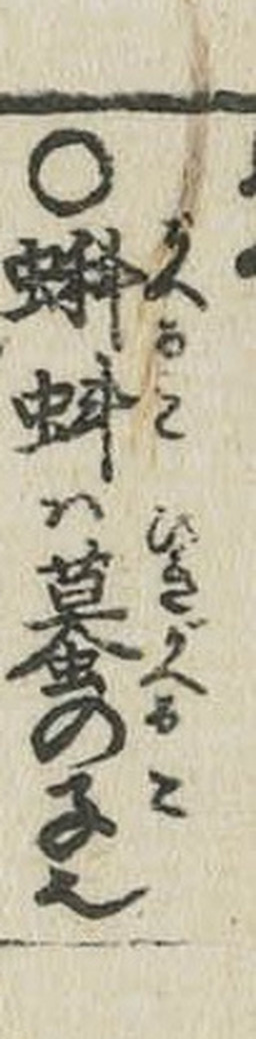○蝌蚪は蟇の子也
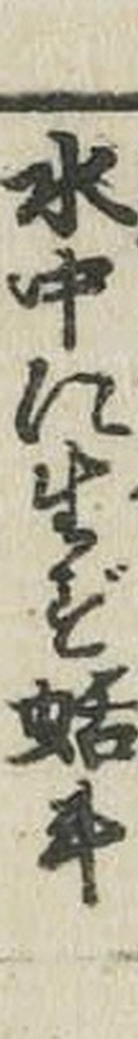水中に生ず蛞斗
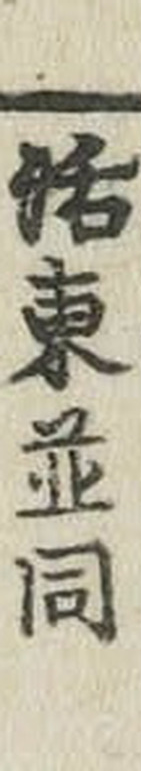活東並同
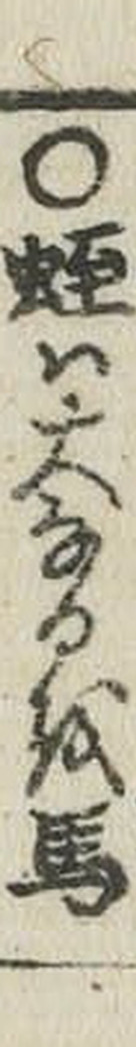○蛭は大なるを馬
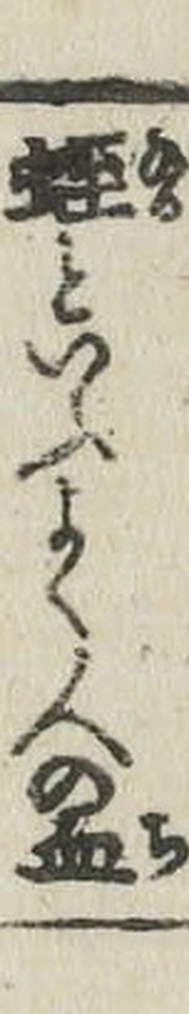蛭といふよく人の血
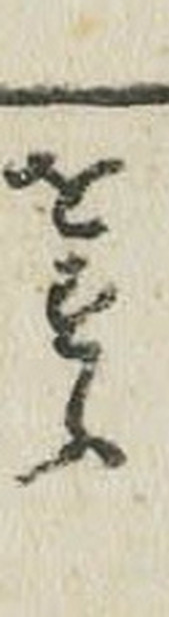をすふ
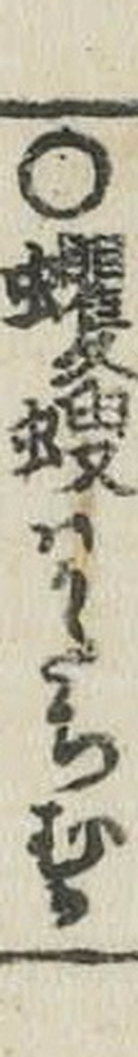○蠼螋はかたちむか
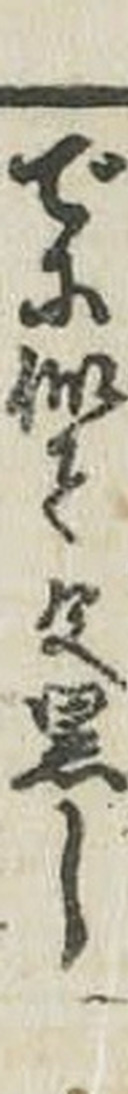でに似て色黒し
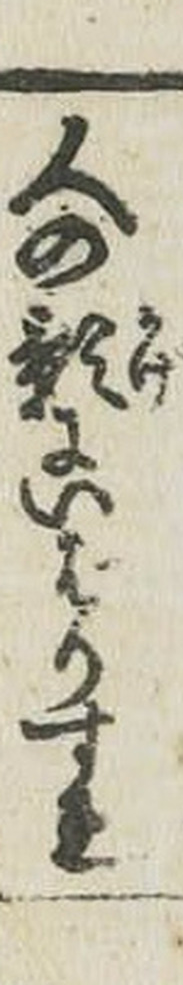人の影にいばりすれ
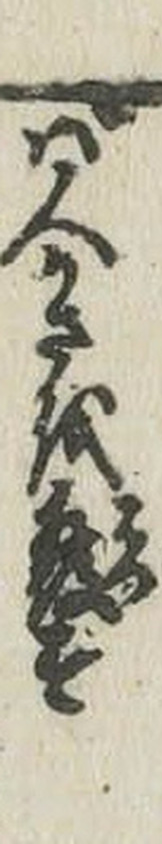ば人かさを発す
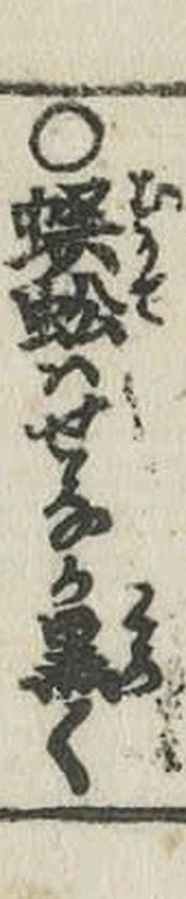○蜈蚣はせなか黒く
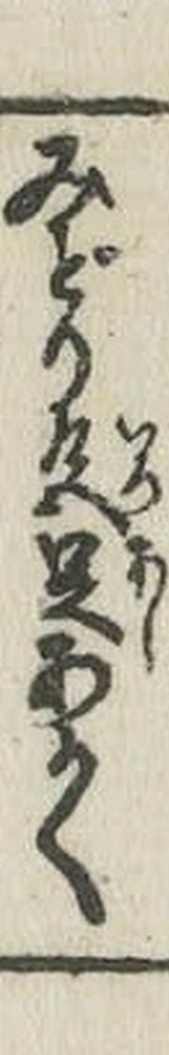みどり色足あかく
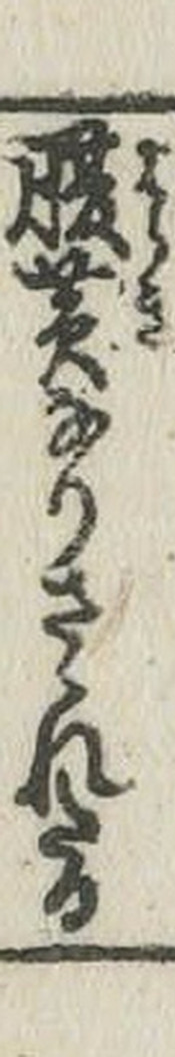腹黄なりさゝれたる
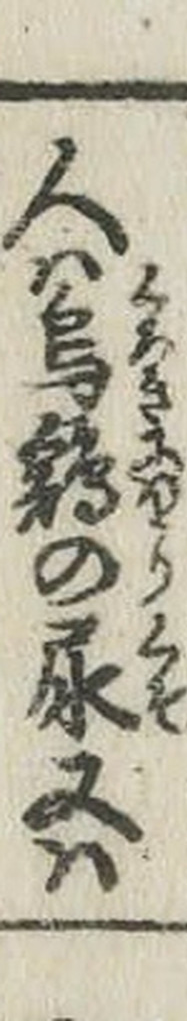人は烏鶏の尿又は
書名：増補頭書訓蒙図彙大成 10巻 7:巻之14-16
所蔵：東京学芸大学教育コンテンツアーカイブ
